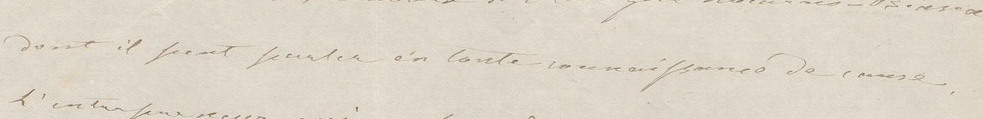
dont il peut parler en toute connaissance de cause,
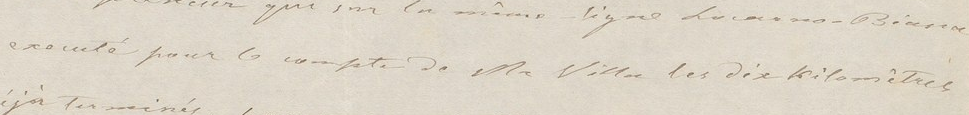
a executé pour le compte de Mr Villa les dix kilomètres
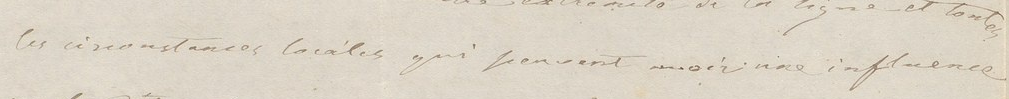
les circonstances locales qui peuvent avoir une influence
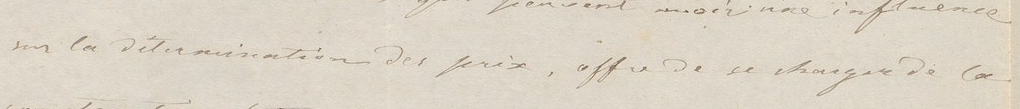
sur la détermination des prix, offre de ce charger de la
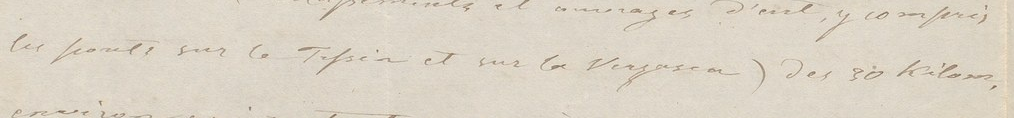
les ponts sur le Tessin et sur la Verzasca) des 30 Kilom.
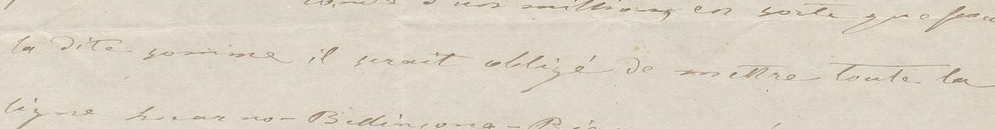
la dite somme il serait obligé de mettre toute la
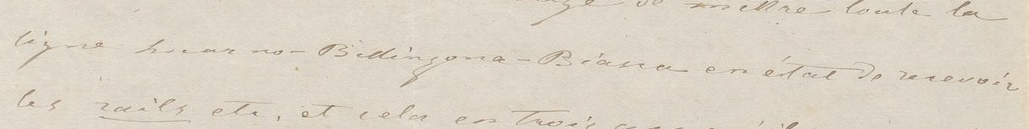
ligne Locarno–Bellinzona–Biasca en état de recevoir
